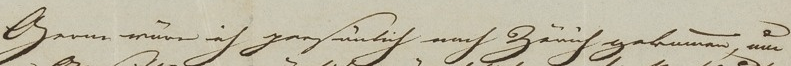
Gerne wäre ich persönlich nach Zürich gekommen, um
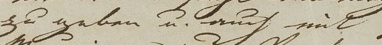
zu geben u. auch mit
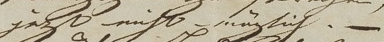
jezt nicht möglich. –
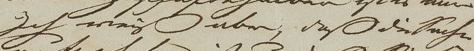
Ich weiß aber, daß die Sache
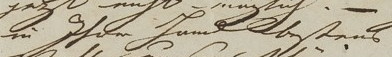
in Ihrer Hand bestens
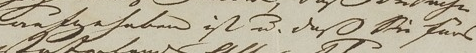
aufgehoben ist u. daß Sie fürs
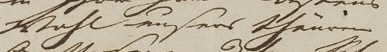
Wohl unsres theuren
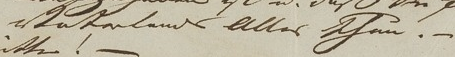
Vaterlands Alles thun. –
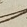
ergebener
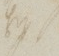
1845.
